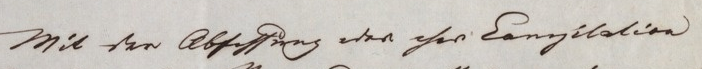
Mit der Abfassung oder eher Compilation
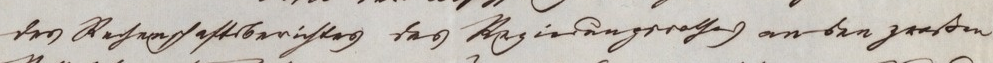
des Rechenschaftsberichtes des Regierungsrathes an den großen
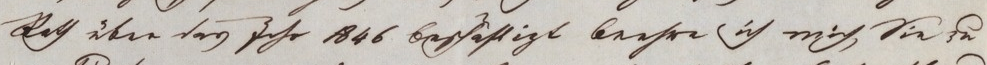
Rath über das Jahr 1846 beschäftigt beehre ich mich, Sie zu
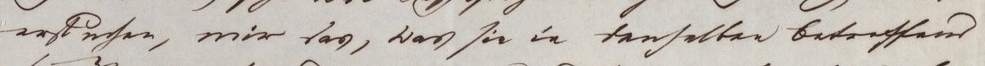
ersuchen, mir das, was sie in denselben betreffend
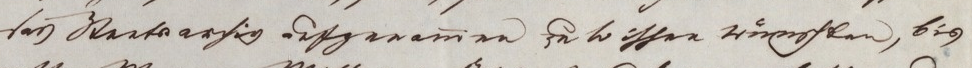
das Staatsarchiv aufgenommen zu wissen wünschen, bis
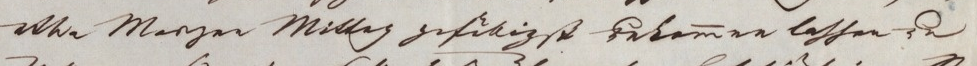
etwa Morgen Mittag gefälligst zukommen lassen zu
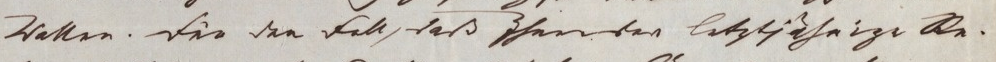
wollen. Für den Fall, daß Ihnen der letztjährige Re-
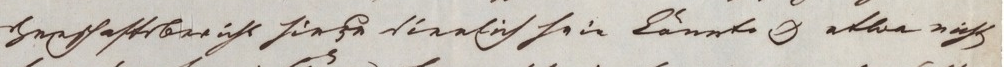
chenschaftsbericht hiezu dienlich sein könnte & etwa nicht
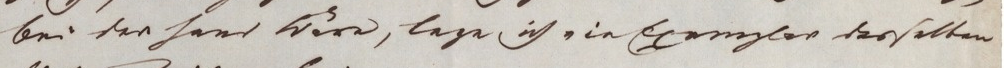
bei der Hand wäre, lege ich ein Exemplar desselben
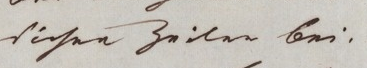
diesen Zeilen bei.
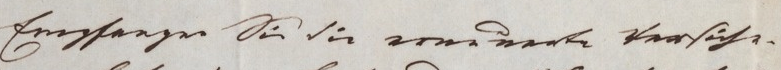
Empfangen Sie die erneuerte Versiche-
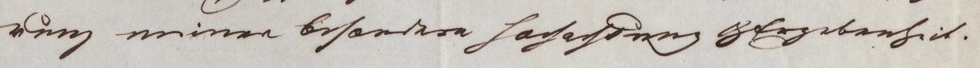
rung meiner besondern Hochachtung & Ergebenheit.
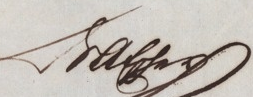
Dr A Escher
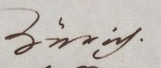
Zürich.
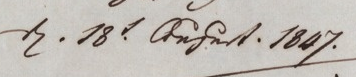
d. 18t August. 1847.
